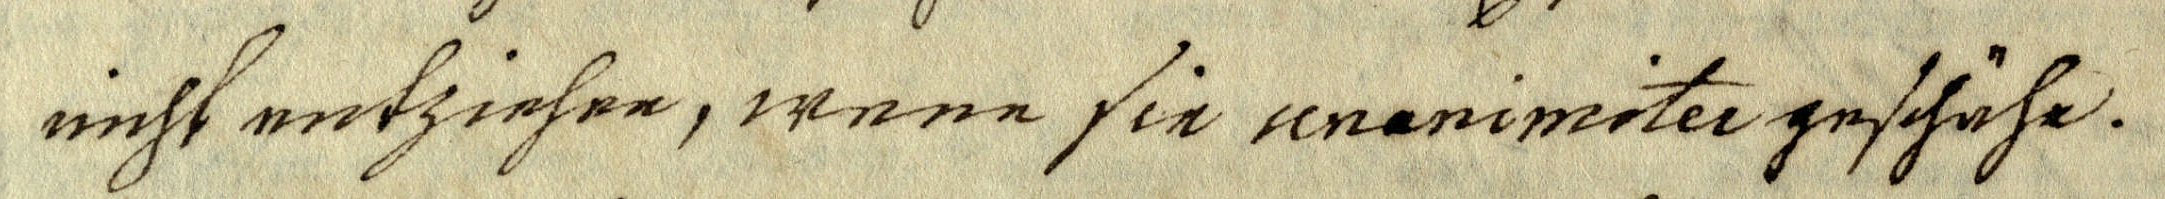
nicht entziehen, wenn sie unanimiter geschähe.
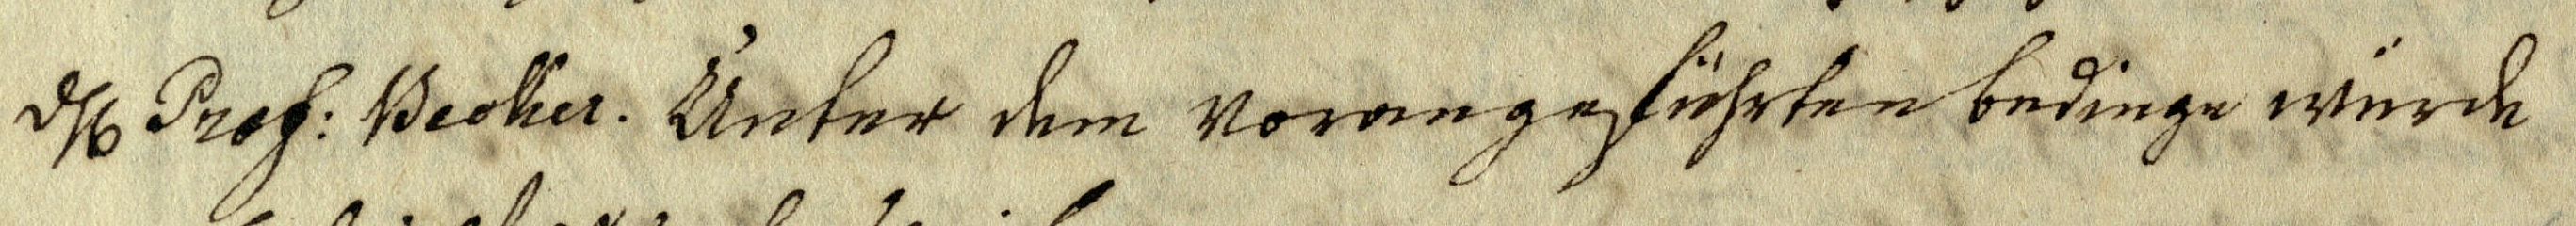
dh Prof. Becker. Unter dem vorangeführten bedinge würde
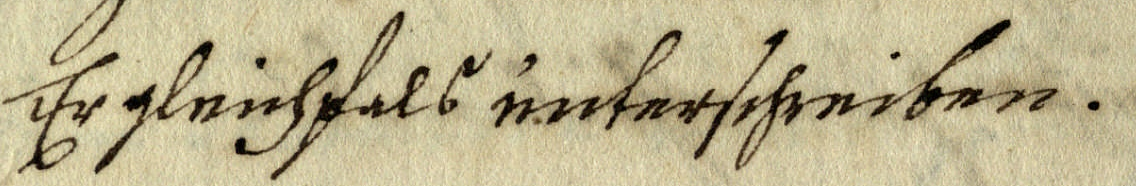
Er gleichfals unterschreiben.
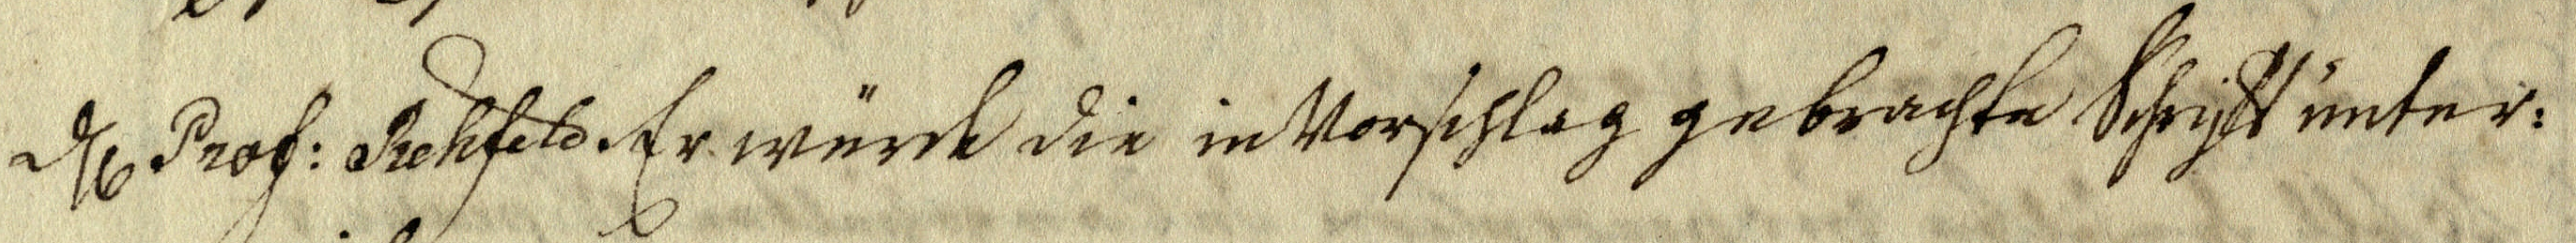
dh Prof. Rehfeld Er würde die in Vorschlag gebrachte Schrift unter¬
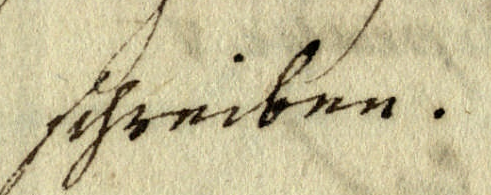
schreiben.
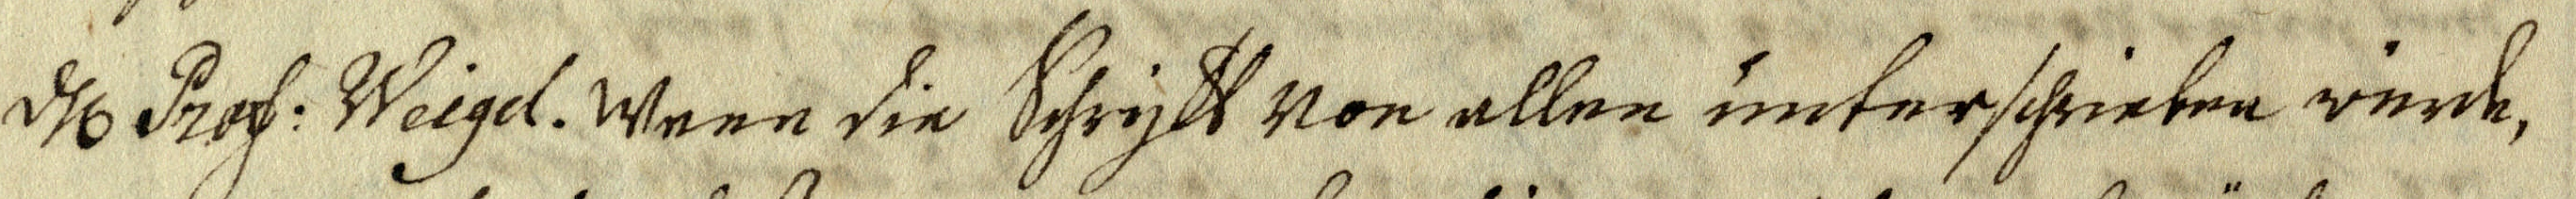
dh. Prof. Weigel. Wenn die Schrift von allen unterschrieben würde,
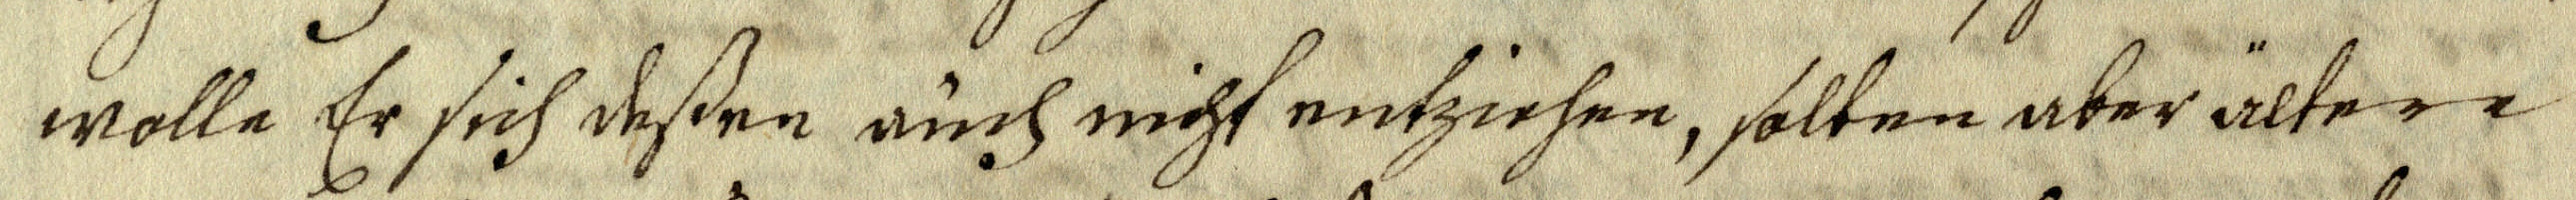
wolle Er sich deßen auch nicht entziehen, solten aber ältere
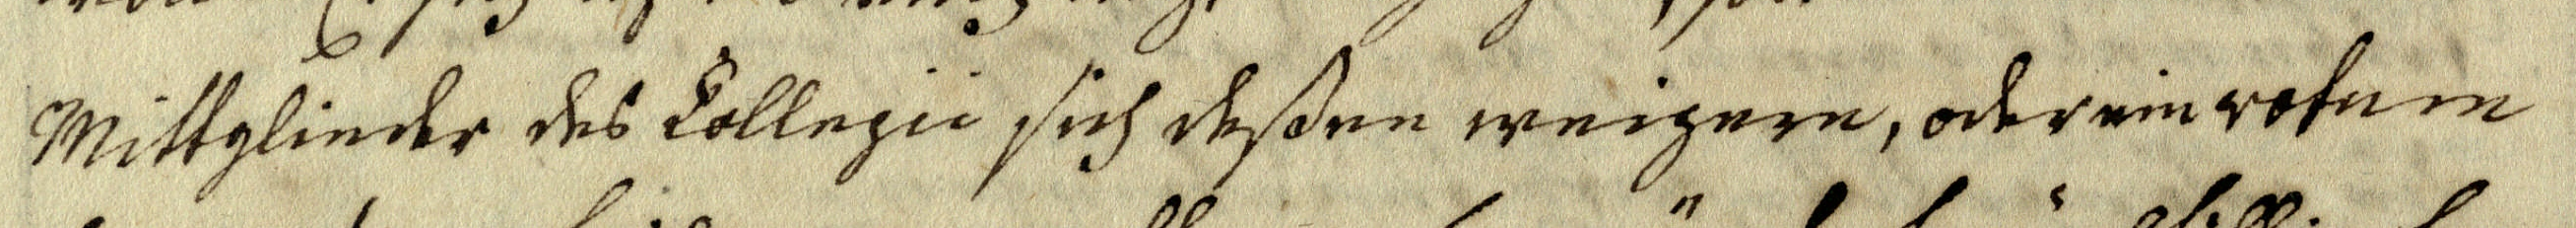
Mittglieder des Collegii sich deßen weigern, oder ein votum
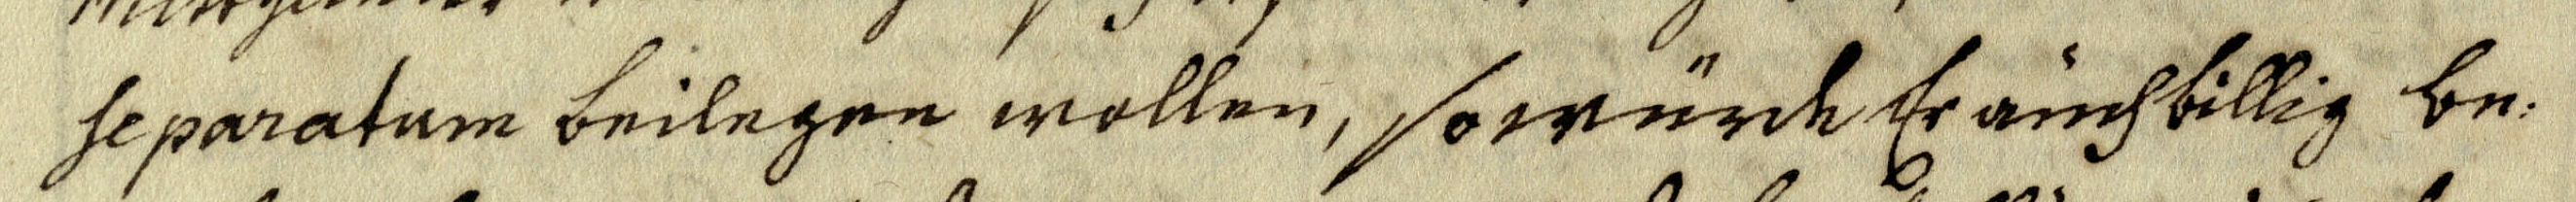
separatum beilegen wollen, so würde Er auch billig Be¬
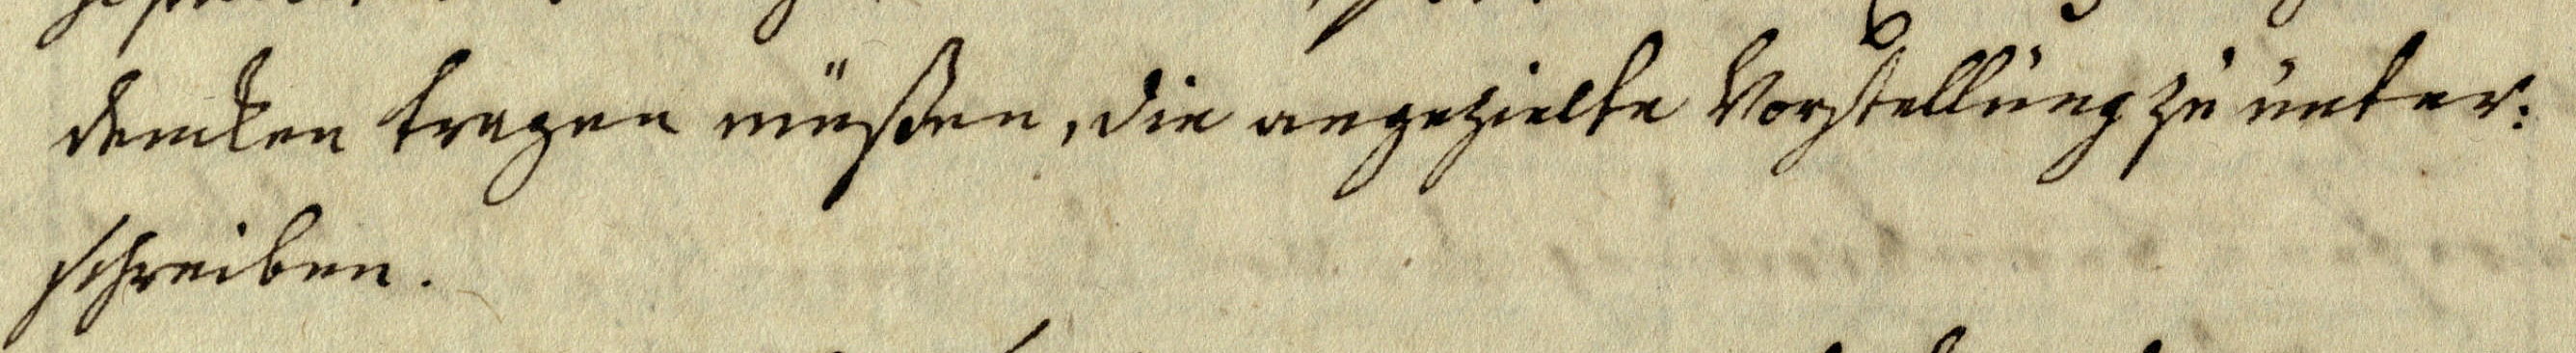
dencken tragen müßen, die angezielte Vorstellung zu unter
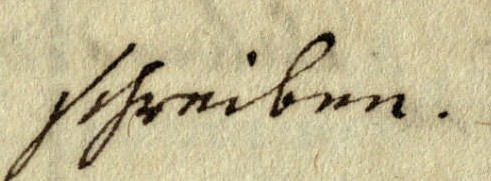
schreiben.
